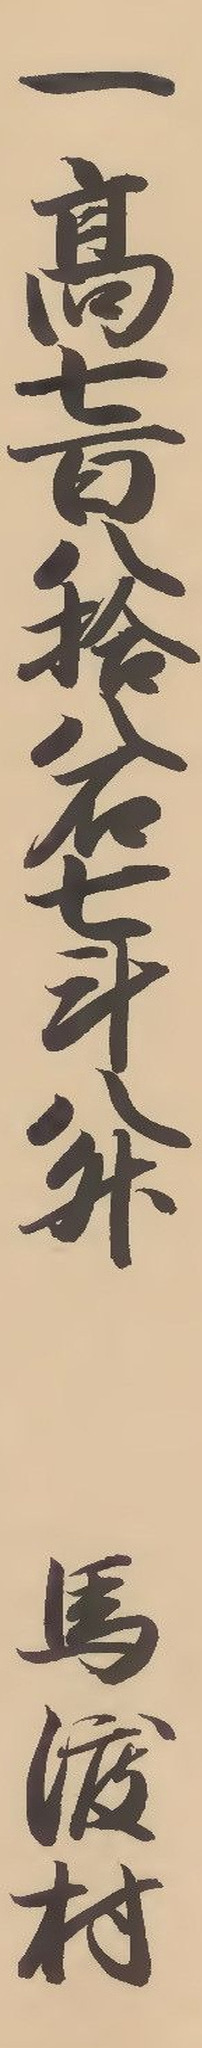一高七百八拾八石七斗八升馬渡村
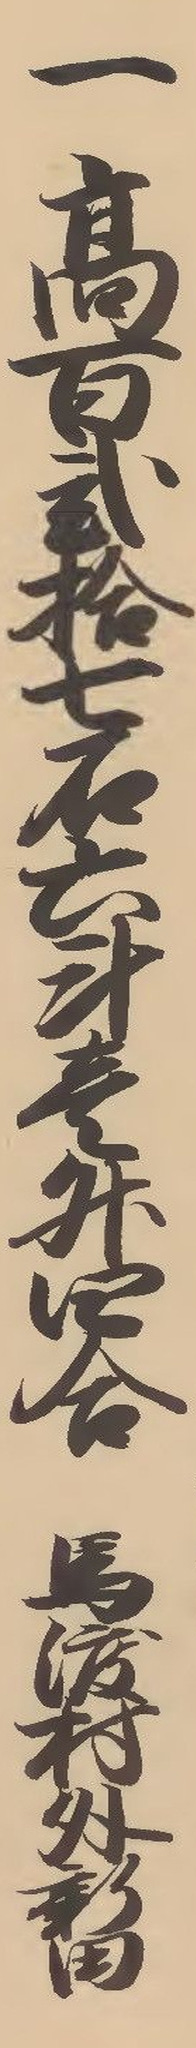一高百弐拾七石六斗壱升四合馬渡村外新田
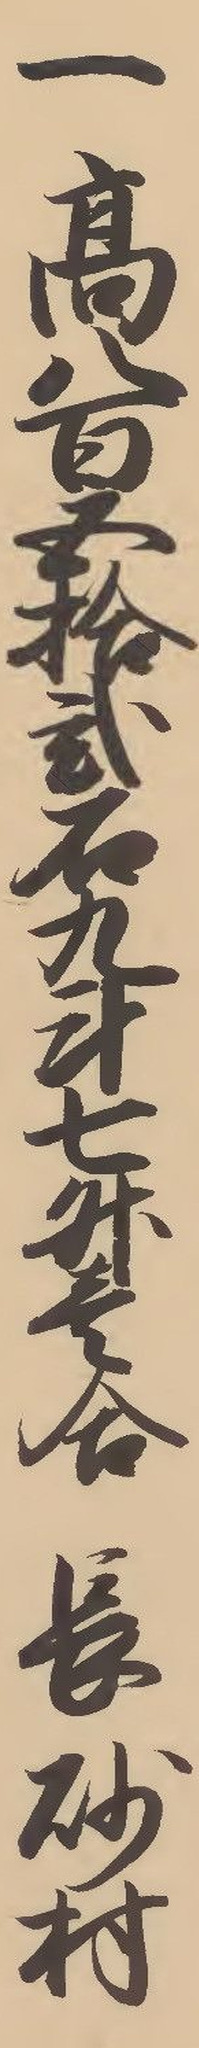一高八百五拾弐石九斗七升壱合長砂村

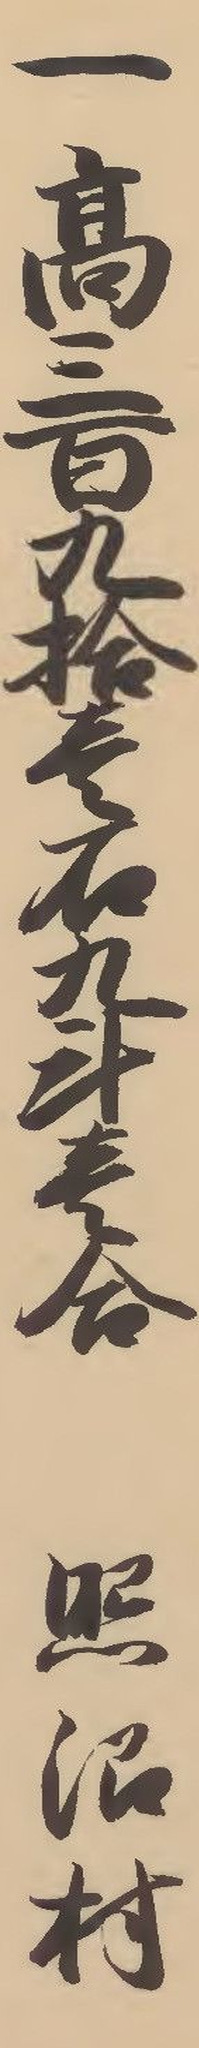一高三百九拾壱石九斗壱合照沼村
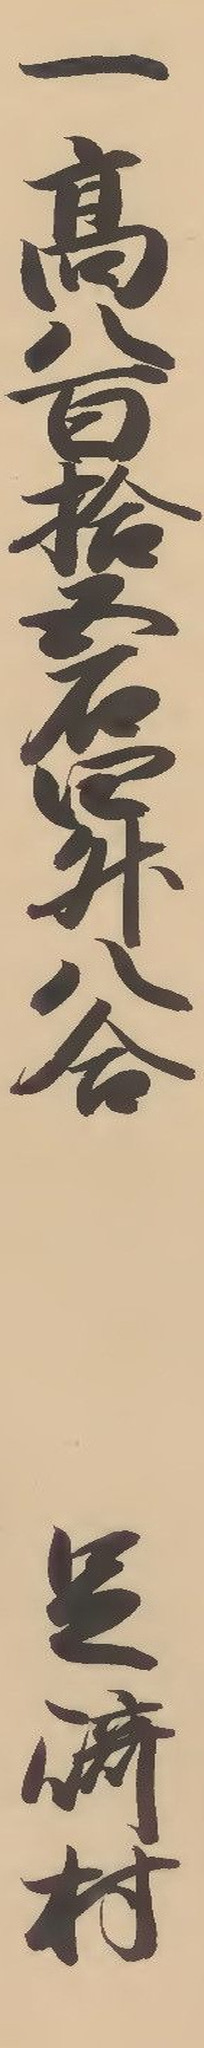一高八百拾五石四升八合足崎村
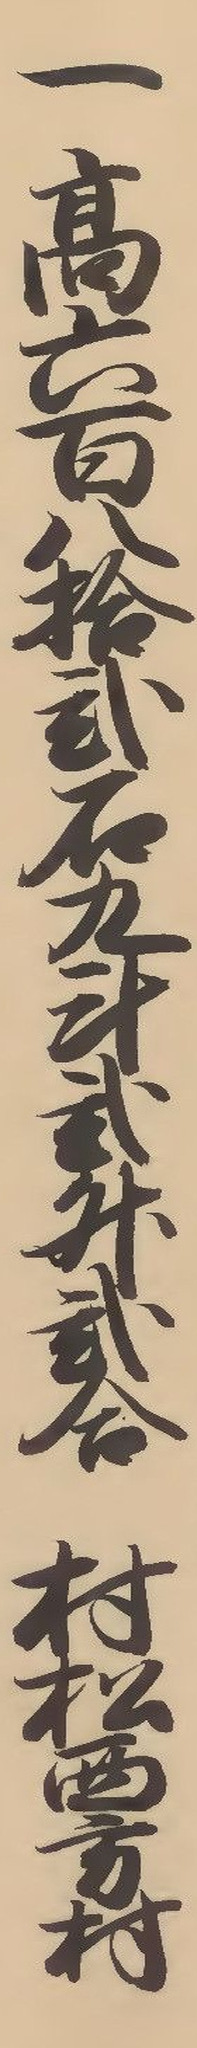一高六百八拾弐石九斗弐升弐合村松西方村
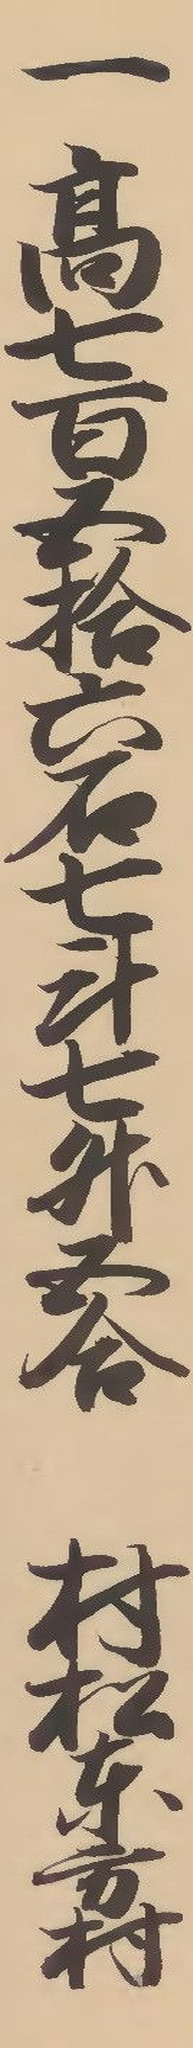一高七百五拾六石七斗七升五合村松東方村
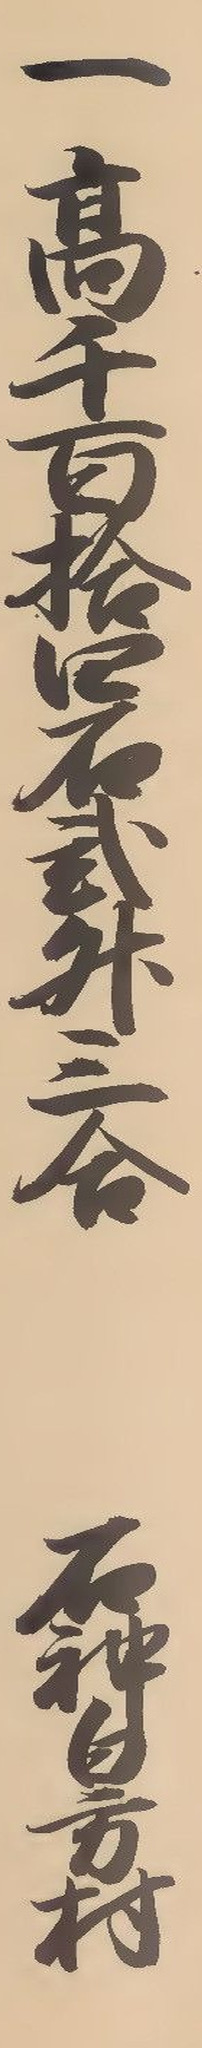一高千百拾四石弐升三合石神白方村
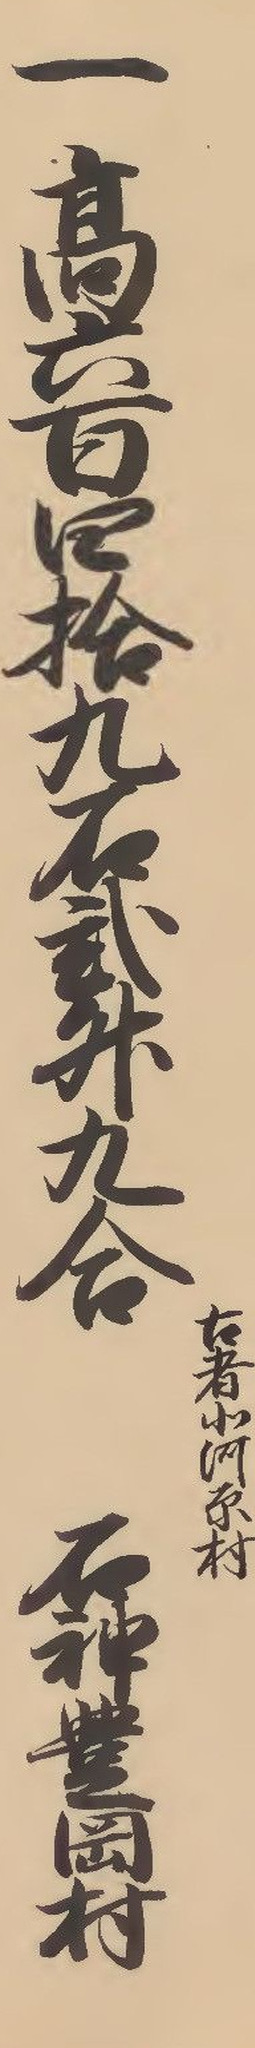一高六百四拾九石弐升九合石神豊岡村
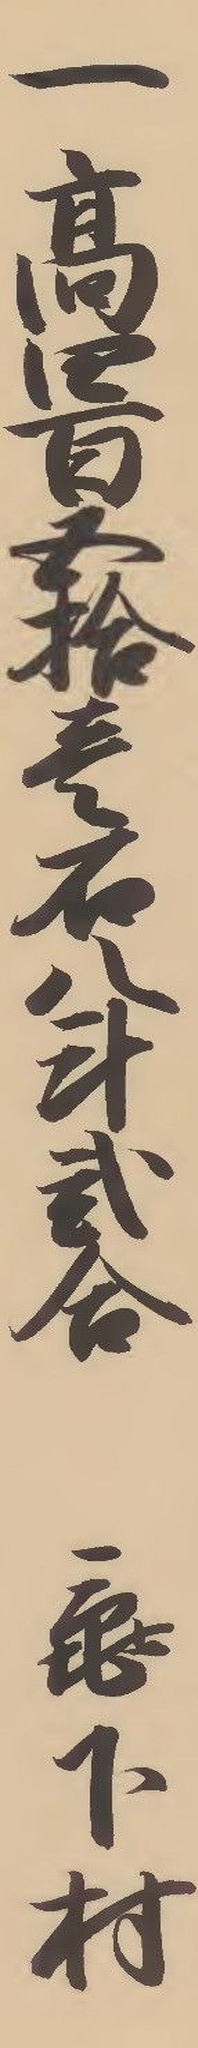一高四百五拾壱石八斗弐合亀下村
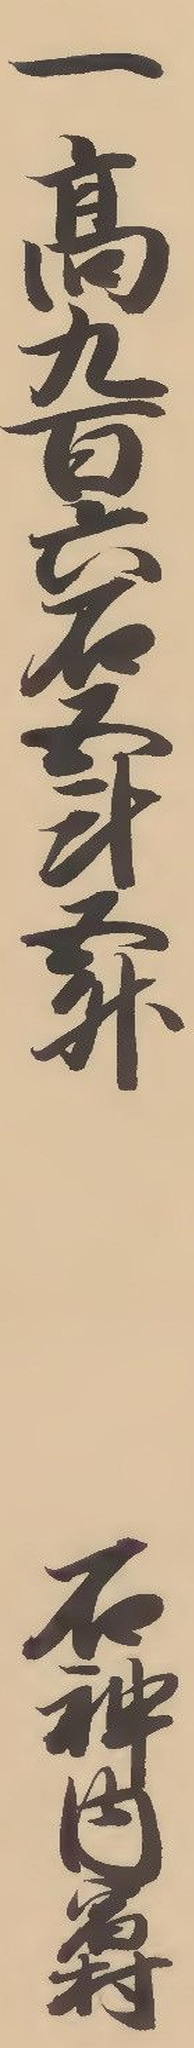一高九百六石五斗五升石神内宿村

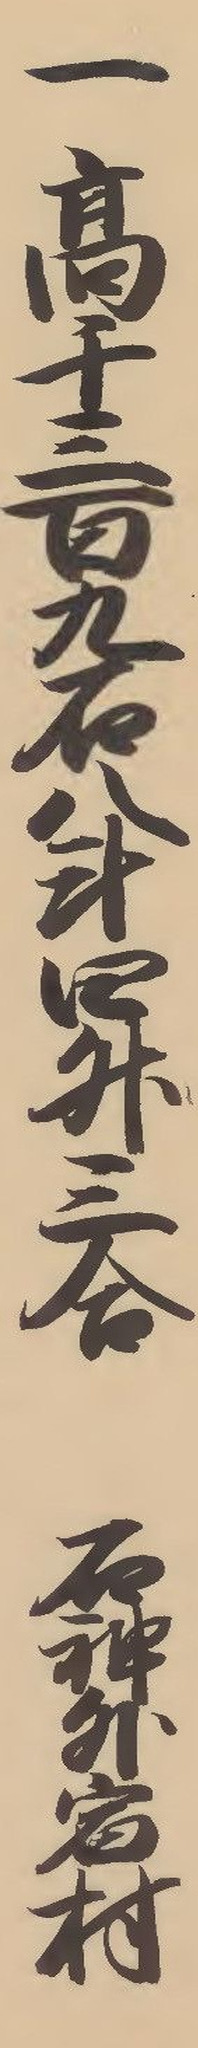一高千三百九石八斗四升三合石神外宿村
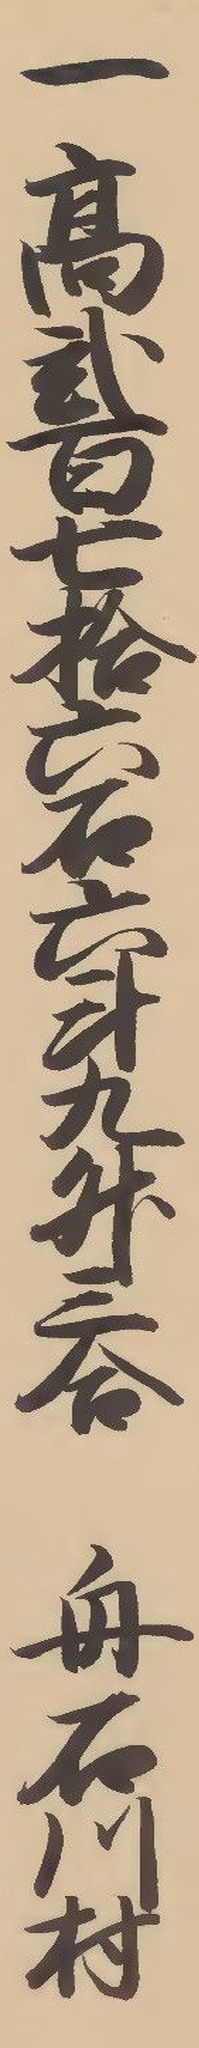一高弐百七拾六石六斗九升三合舟石川村
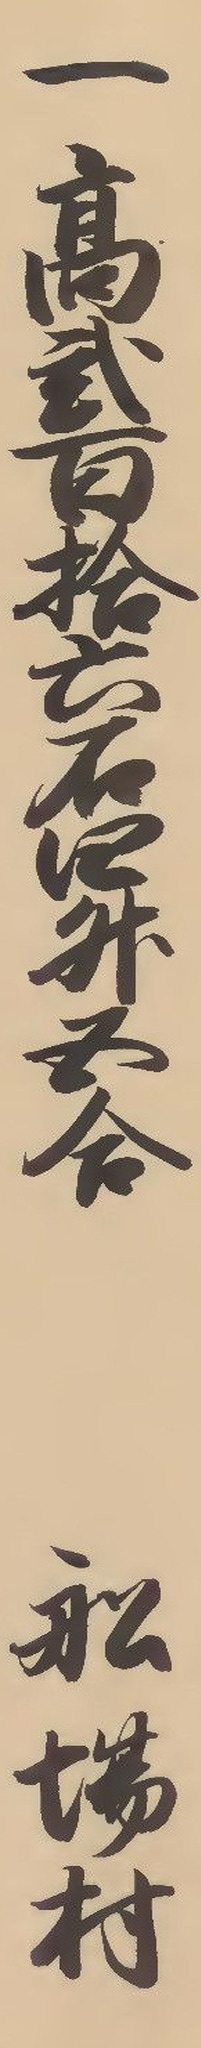一高弐百拾六石四升五合船場村
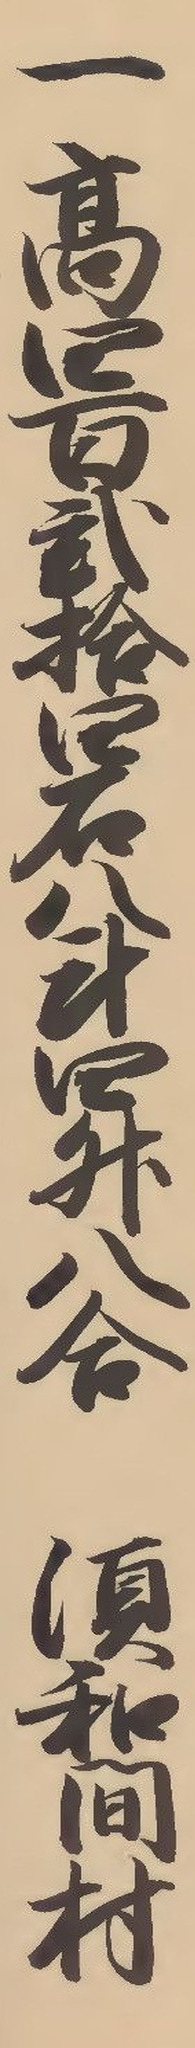一高四百弐拾四石八斗四升八合須和間村
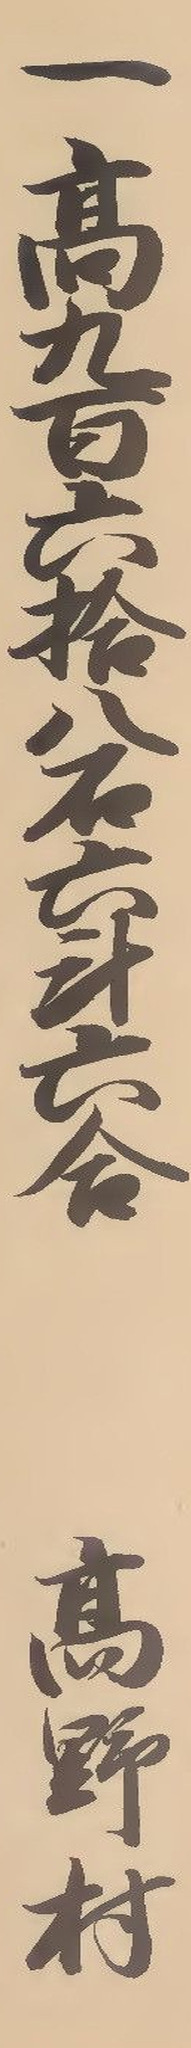一高九百六拾八石六斗六合高野村
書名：常陸国郷帳
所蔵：国立公文書館 National Archives of Japan
